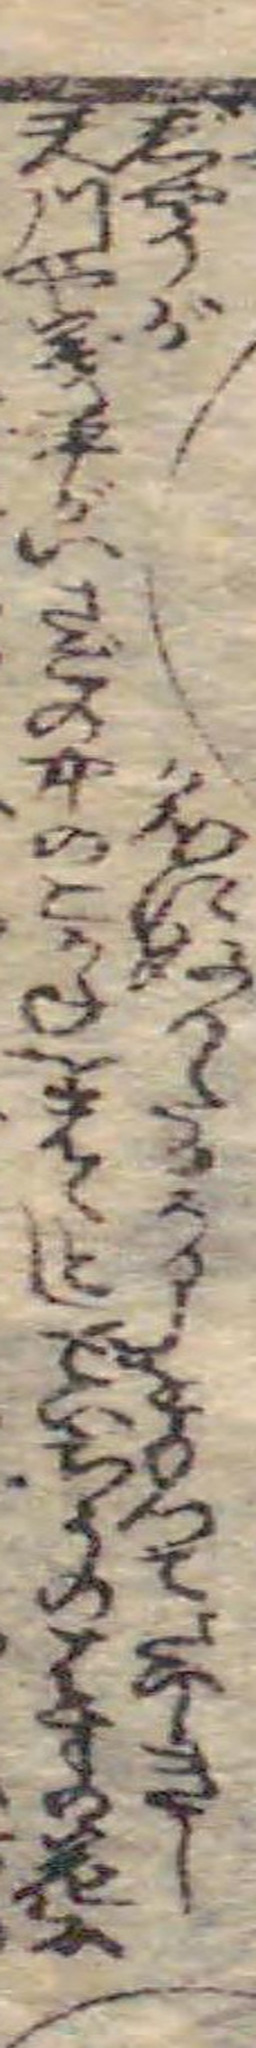天川や義平がいさごの中のこかねをはくとしといちうのはすの花に
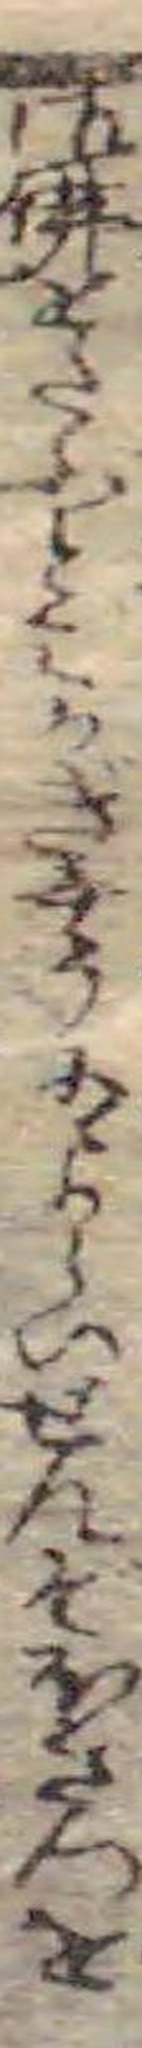御仏をたふとはかぎやうによらいせんぞほきつを
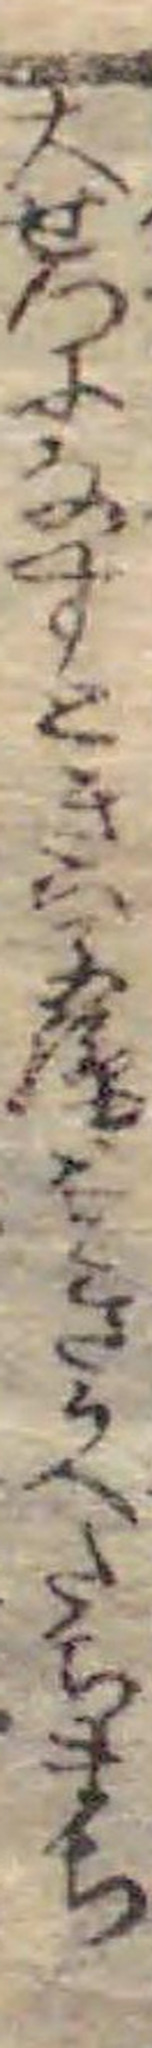大せつになすときは子孫とみさかへたちまち
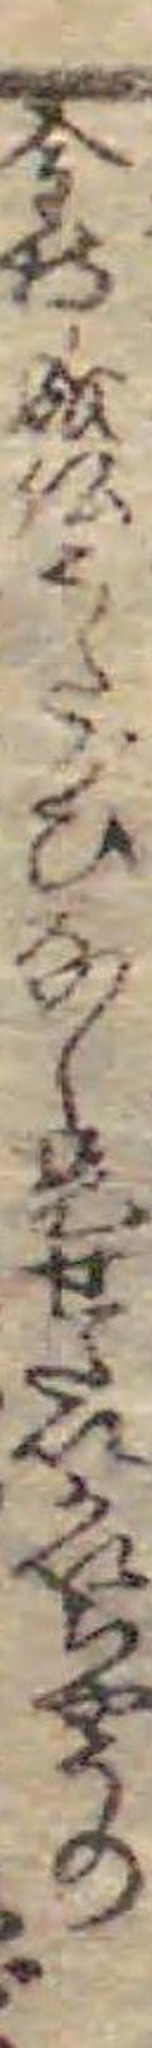金持成仏うたがひなし是せたいかいちやうの
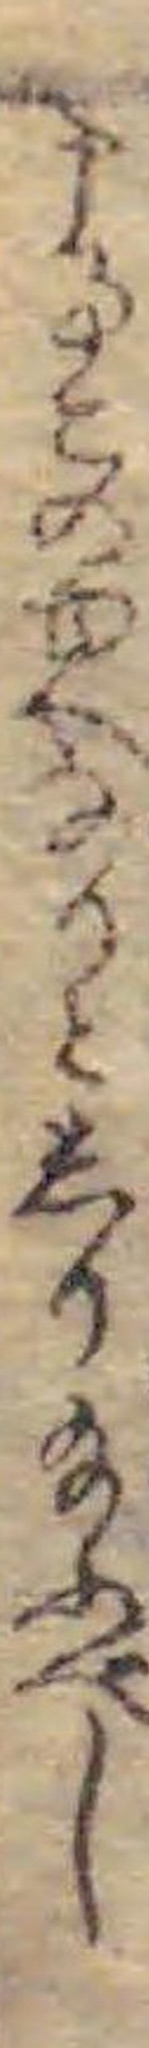申事このゆへなりとしり給ふべし

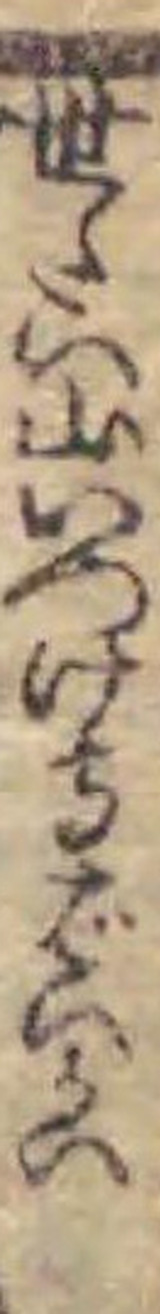世たい山いつけ寺ばいかい
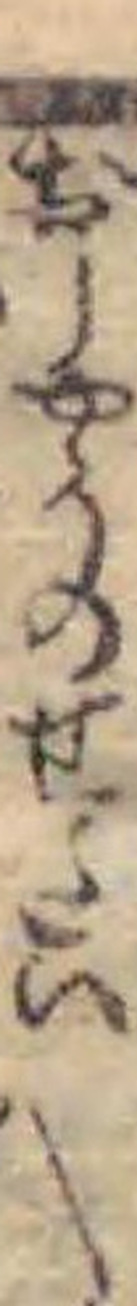おしやうのせたい
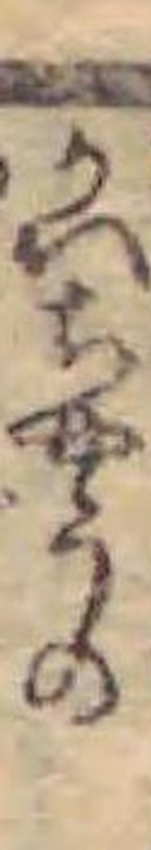かいちやうの
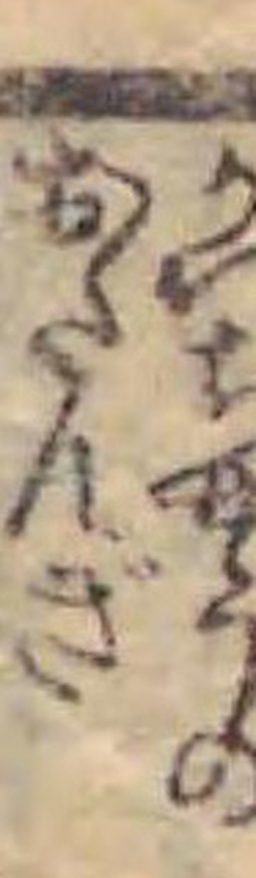おたんぎ
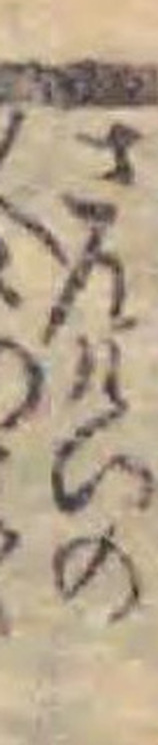さんけいの
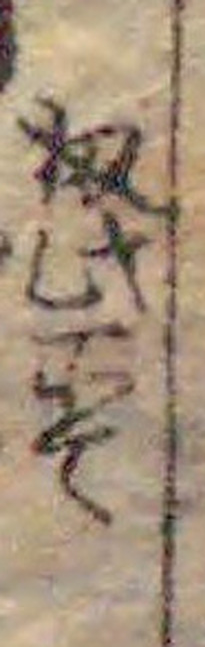扨此所て
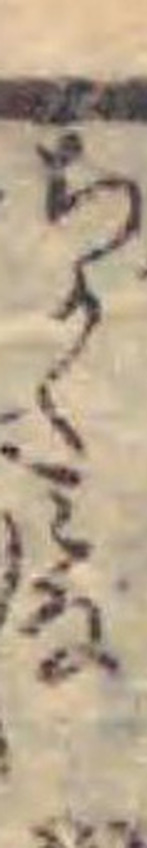ちかくみな〳〵
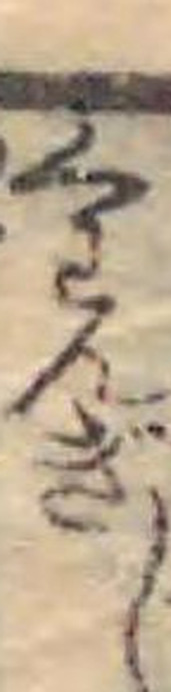くわんぎ
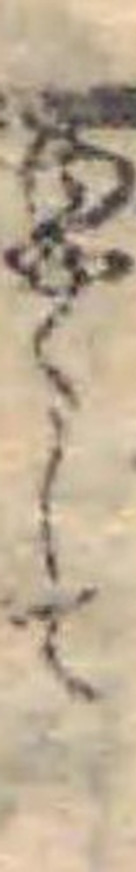ゆやくして
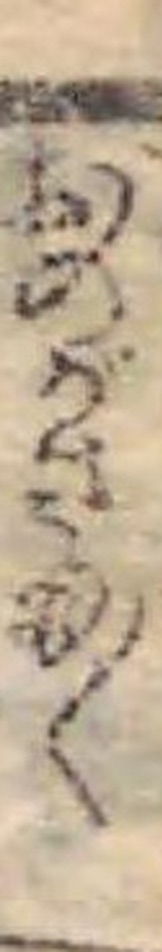おのがさま〳〵
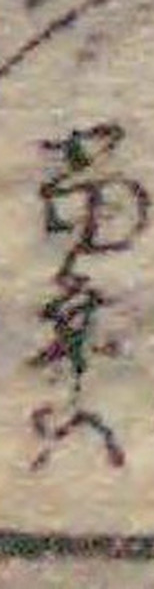当年は
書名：身体開帳略縁起 : 3巻
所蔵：国立国会図書館 National Diet Library, JAPAN
